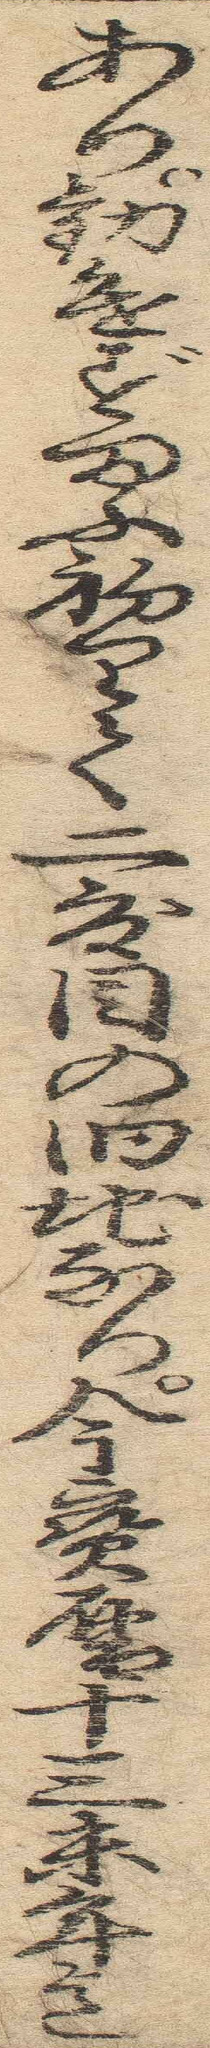あり。勧進ずまふ初りて二度目の旧地なり。今宝暦十三年未迄
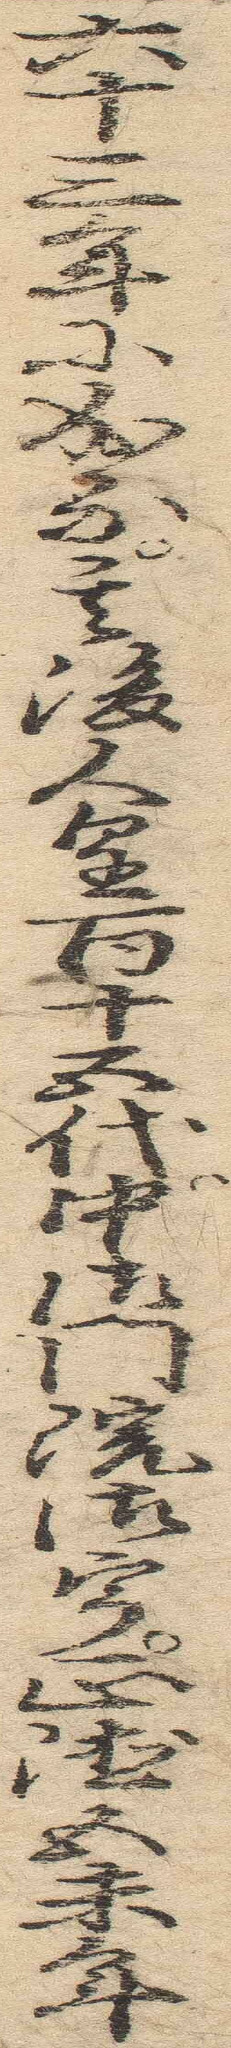六十三年に成る。其後人皇百十五代。中御門院御宇。正徳五未年
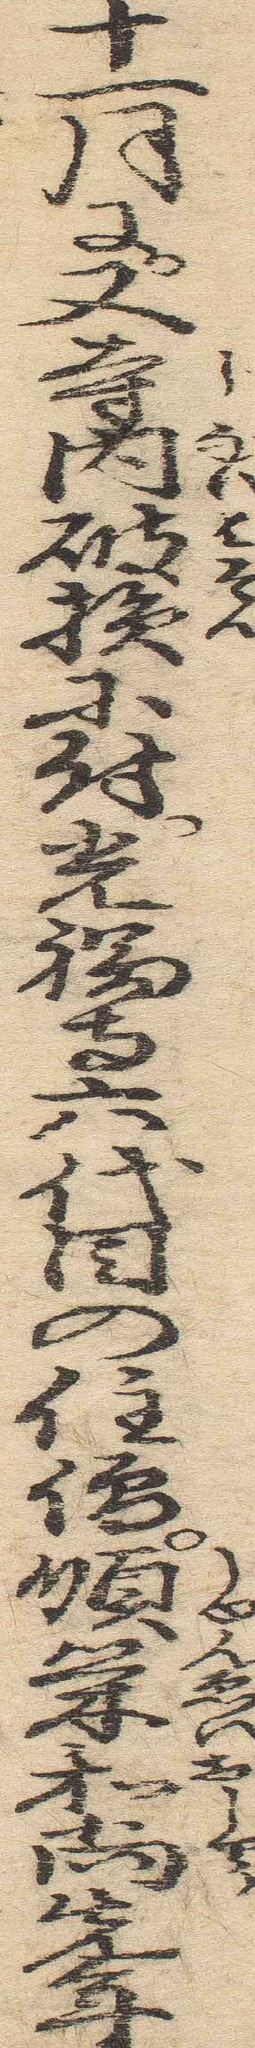十一月に。又寺内破損に付。光福寺六代目の住僧。順栄和尚先年
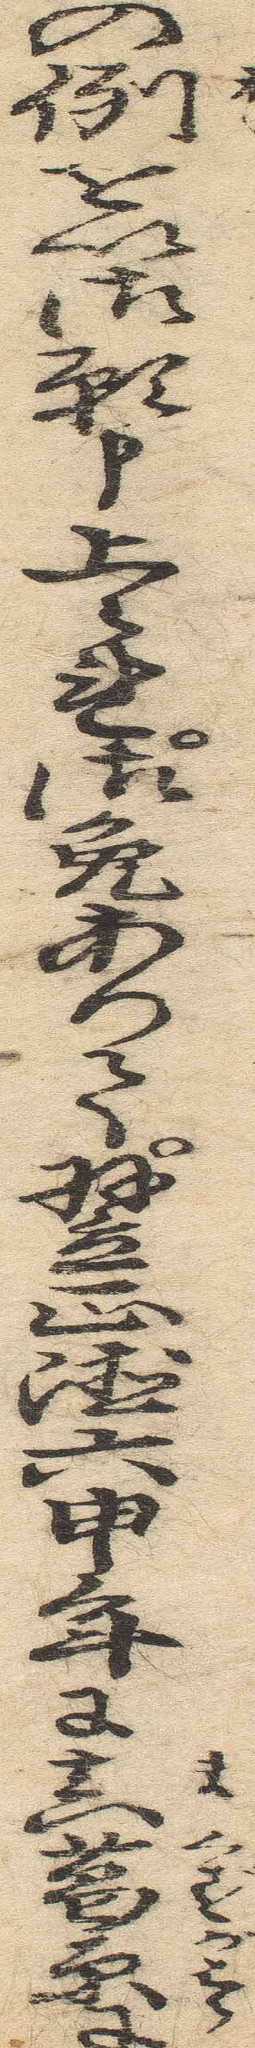の例を以御願申上られ。御免あつて。翌正徳六申年に真葛原に
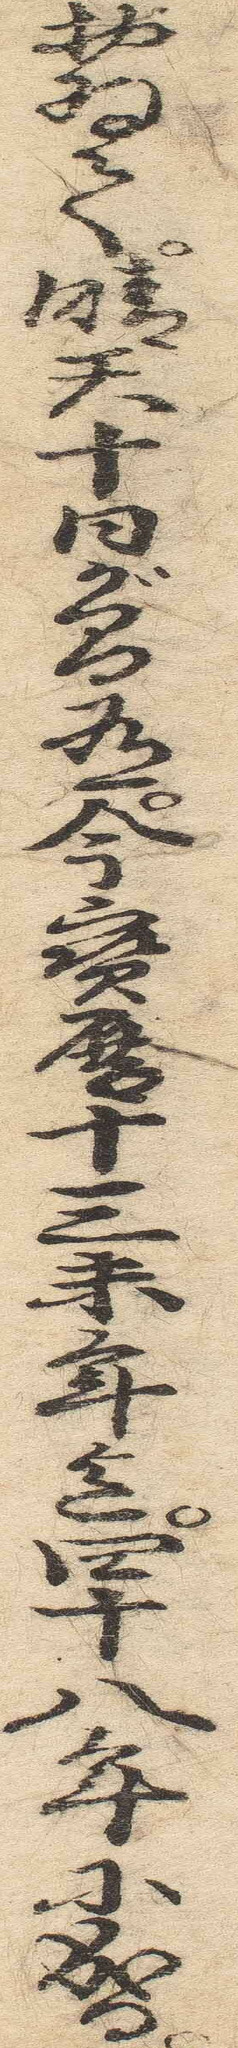おゐて。晴天十日が間有。今宝暦十三未年迄。四十八年に成る。
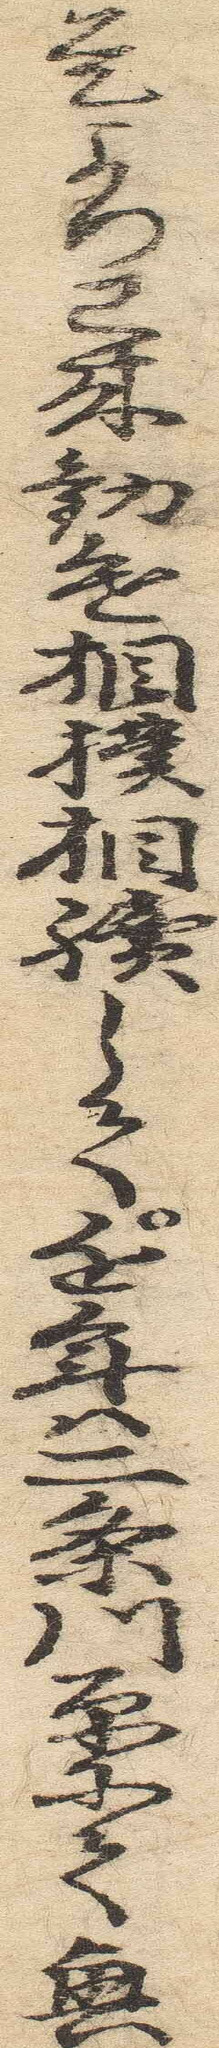是より己來勧進相撲相続して。近年は二条川原にて興
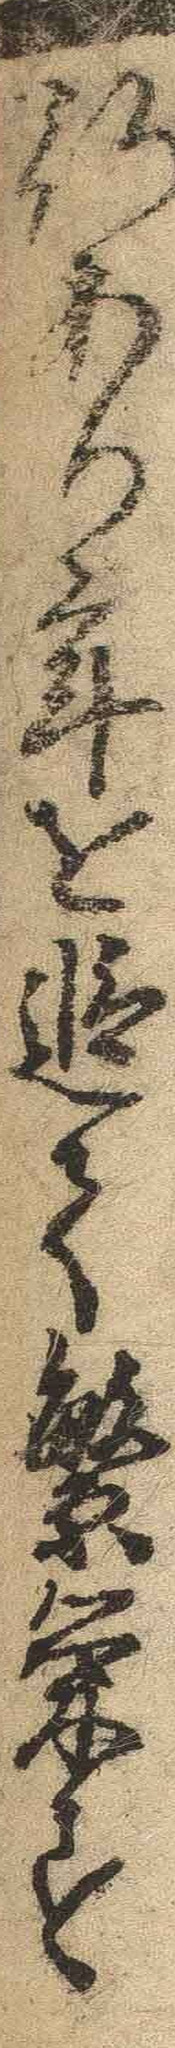行あり年を追て繁栄す
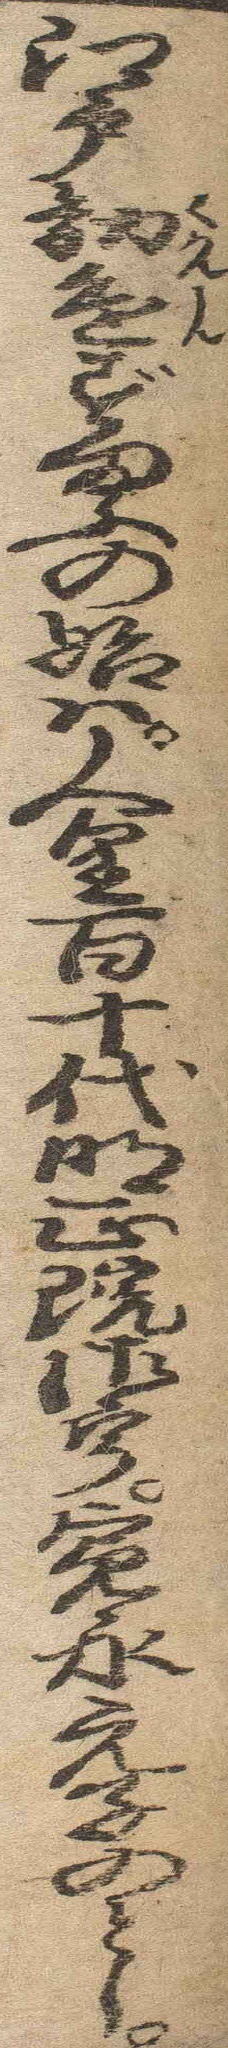江戸勧進ずまふの始は。人皇百十代明正院御宇。寛永元子のとし。
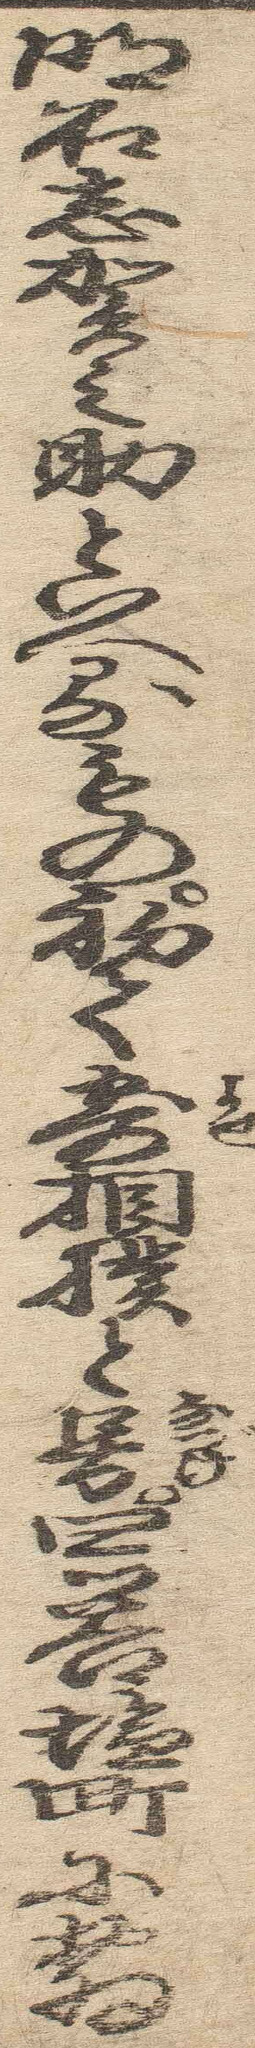明石志賀之助といへるもの。初て寄相撲と号。四ツ谷塩町におゐ
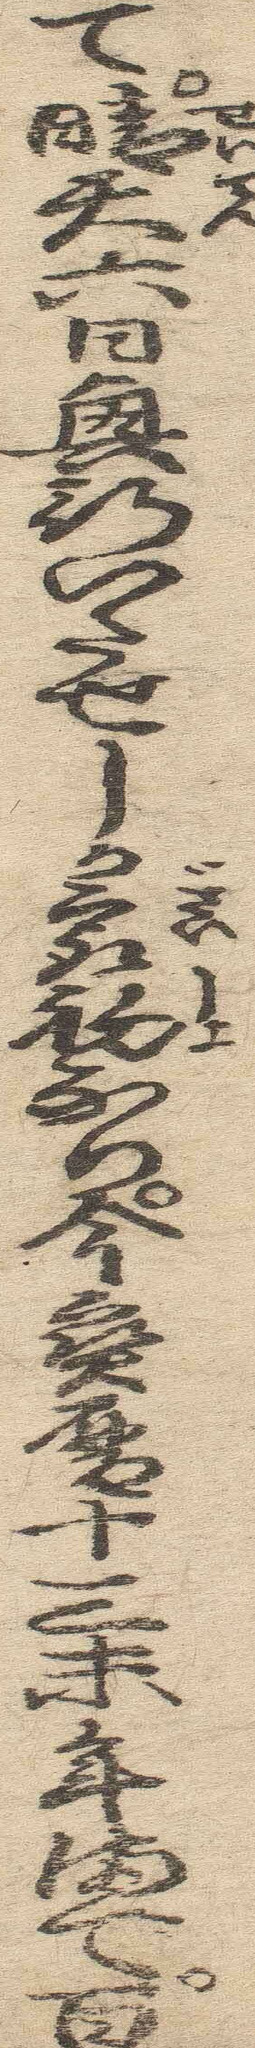て。晴天六日興行いたせしか。最初なり。今宝暦十三未年まて。百
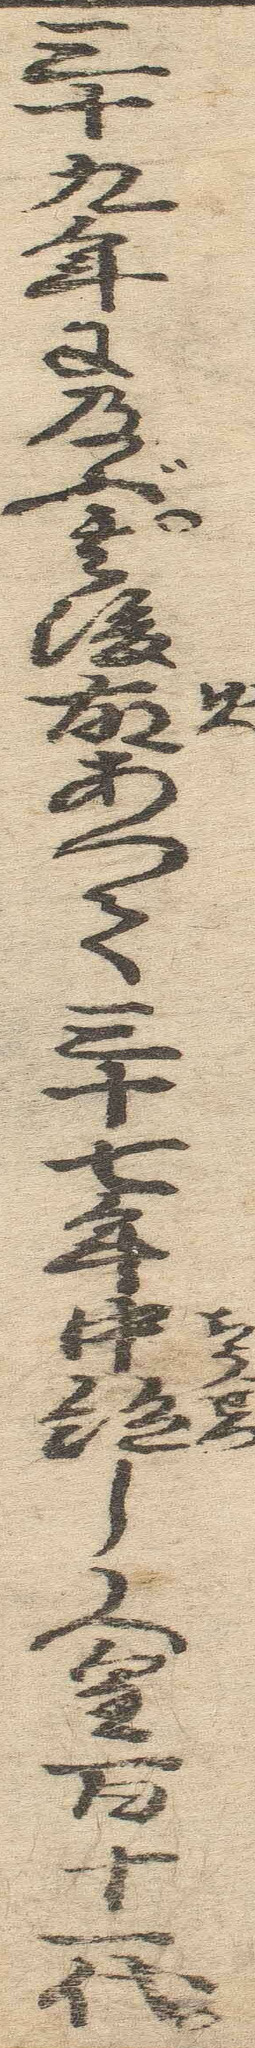三十九年に及ぶ。其後故あつて三十七年中絶し人皇百十一代。
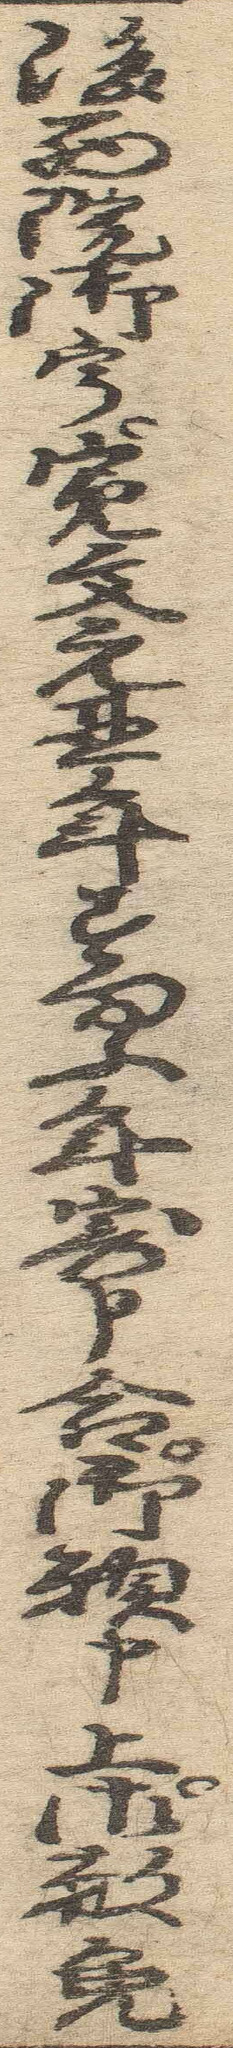後西院御宇。寛文元丑年すまふ年寄申合。御願申上。御赦免
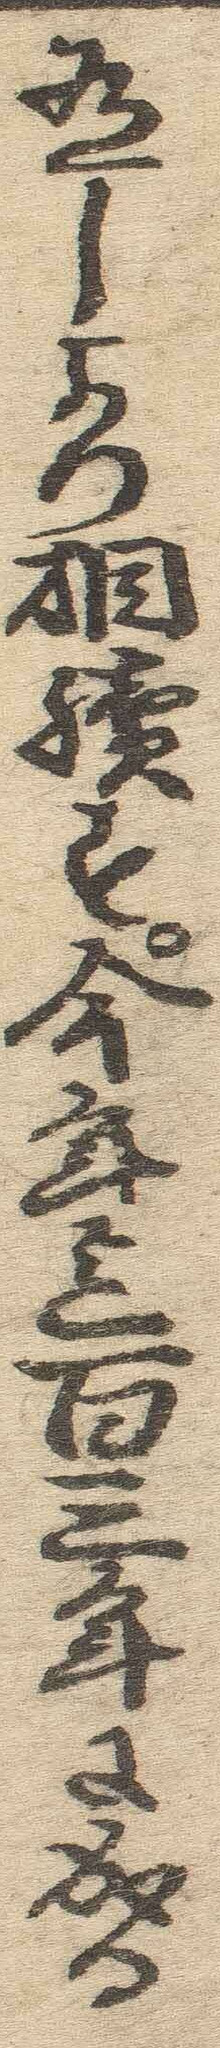有しより相続す。今年迄百三年に成る
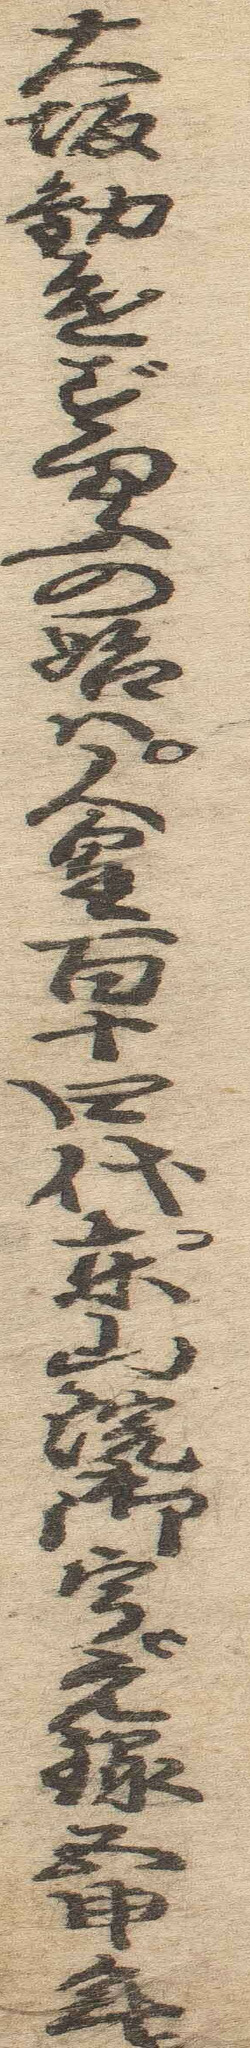大坂勧進ずまふの始は。人皇百十四代。東山院御宇。元禄五申年に
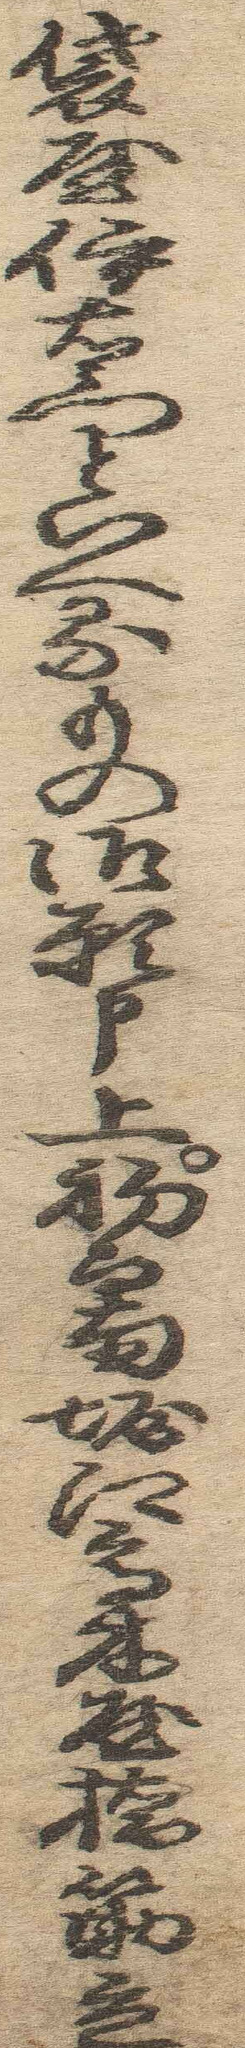袋屋伊右衛門といへるもの御願申上。初而南堀江高木屋橋筋立
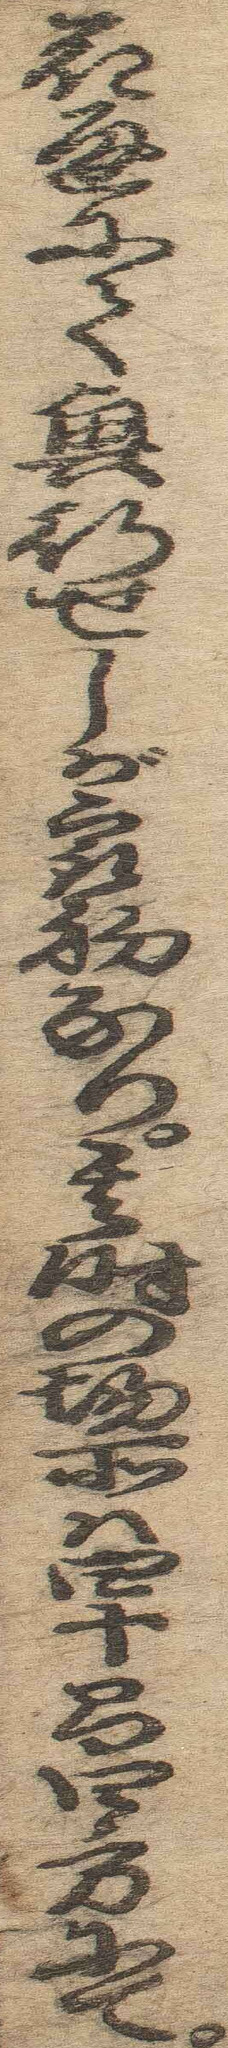花通にて興行せしが最初なり。其時の場所は四十間四方にて。
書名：古今相撲大全
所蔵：東京学芸大学附属図書館 国文学研究資料館
